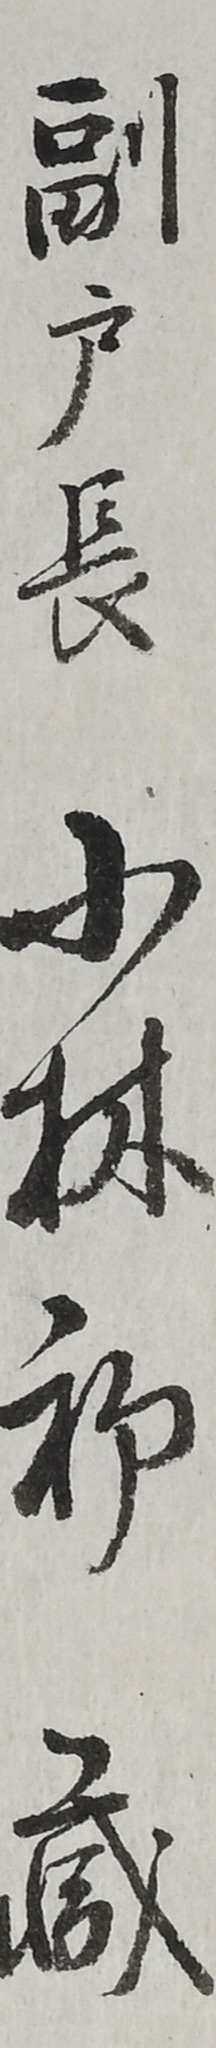副戸長小林初蔵
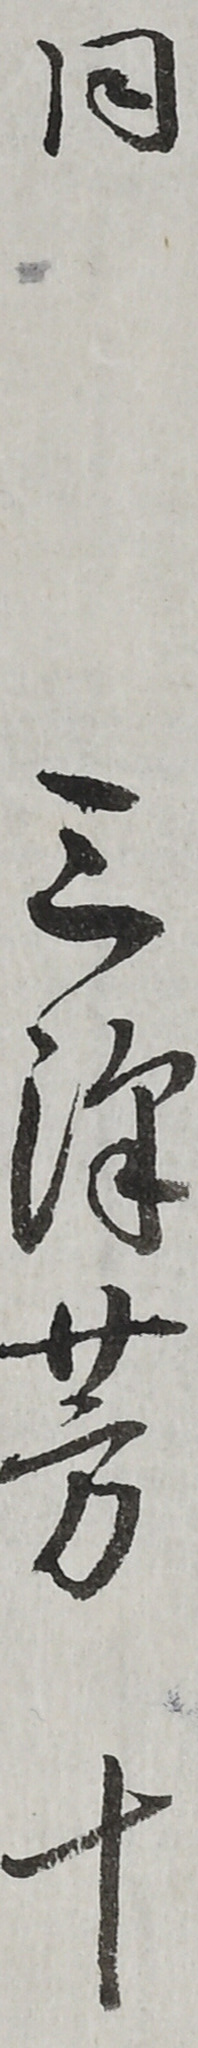同三澤芳十
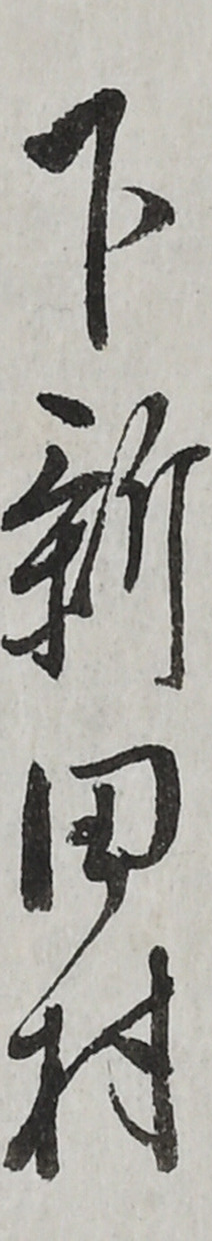下新田村
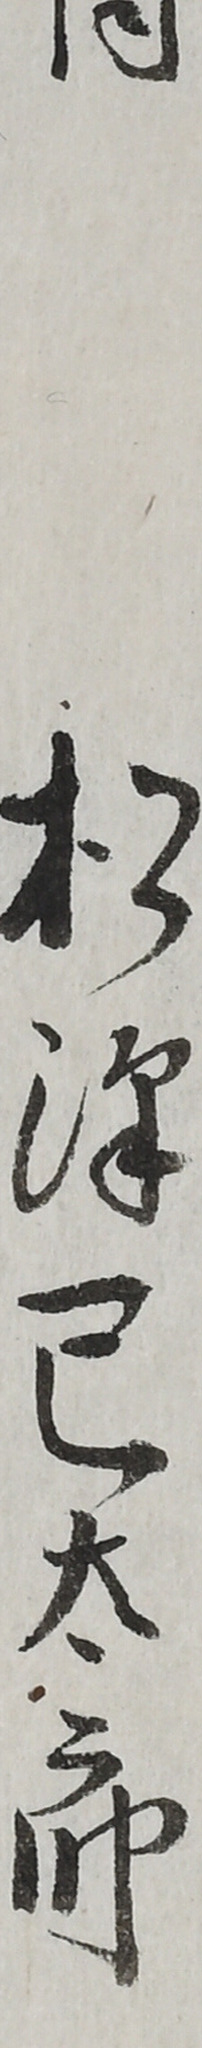同松澤己太郎
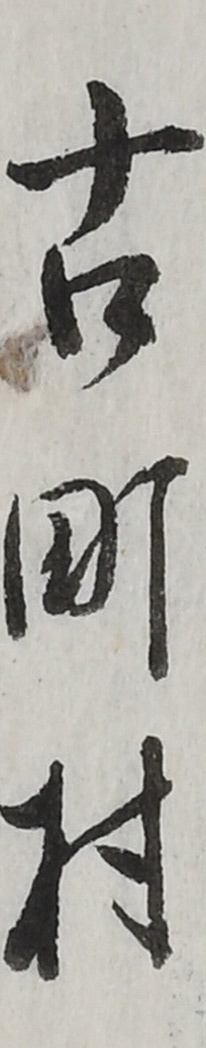古町村
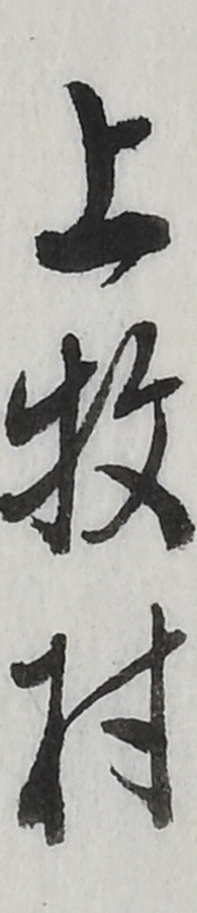上牧村
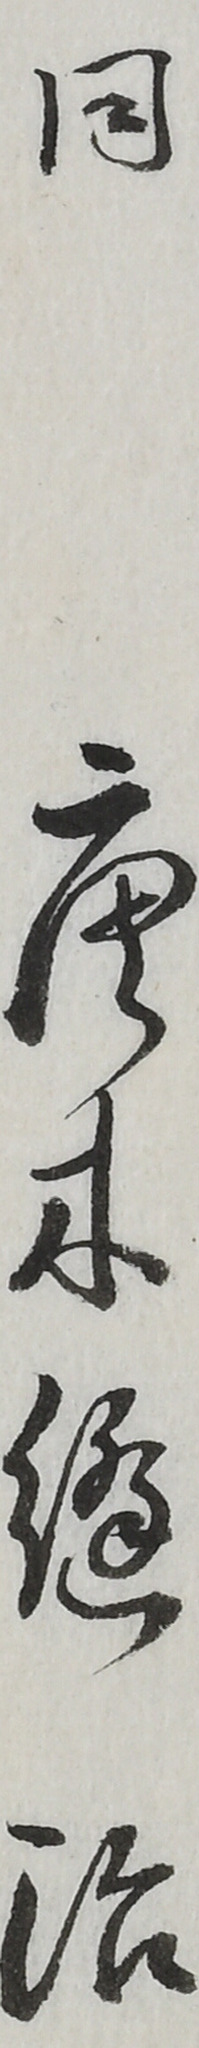同唐木縫治
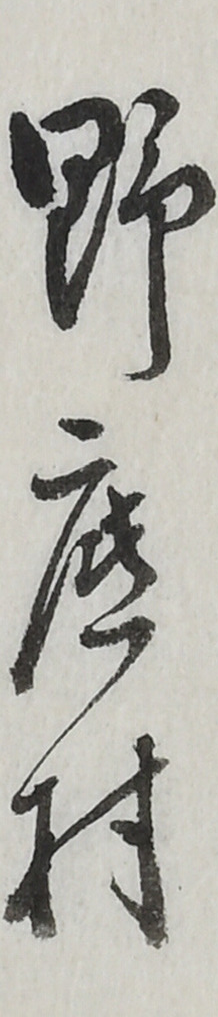野底村
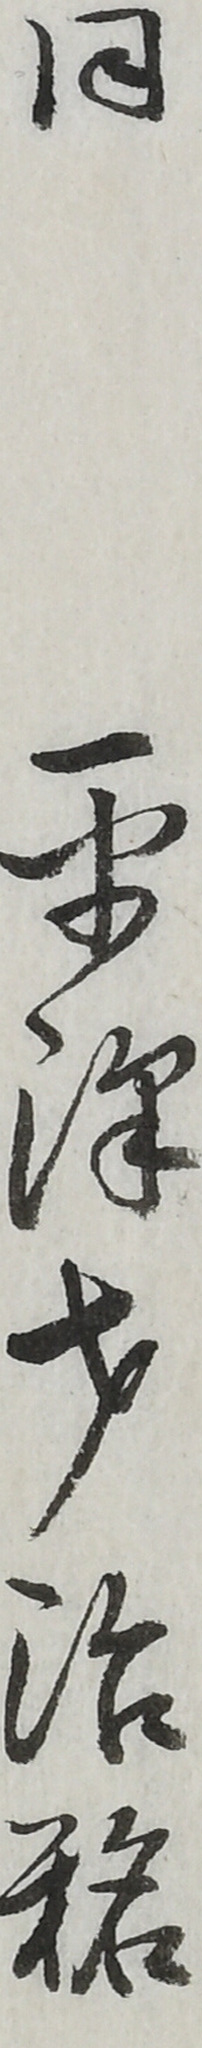同平澤才治祐
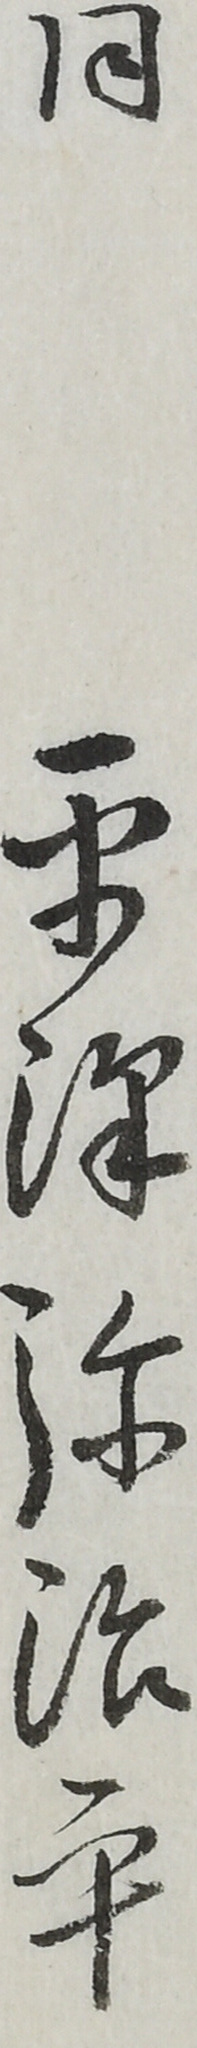同平澤弥治平
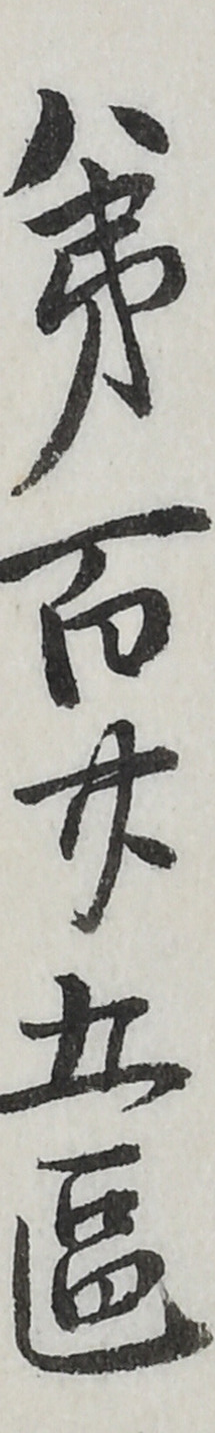第百廿五区

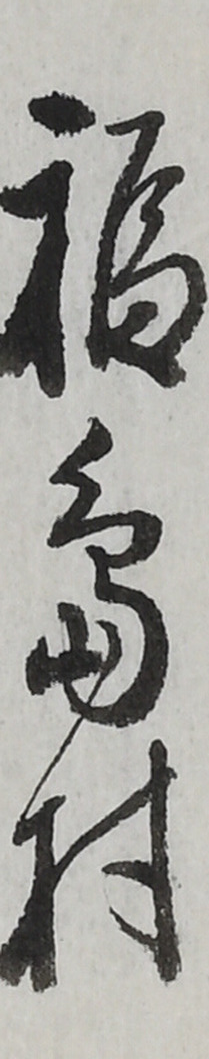福島村
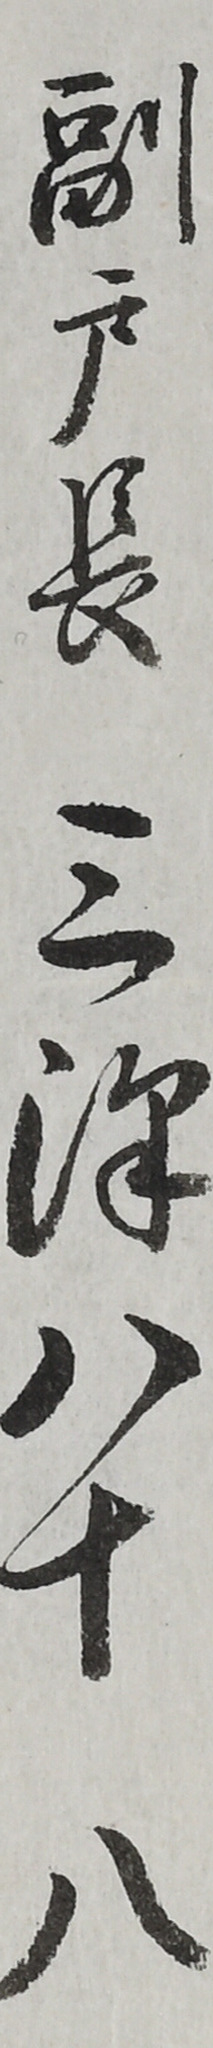副戸長三澤八十八
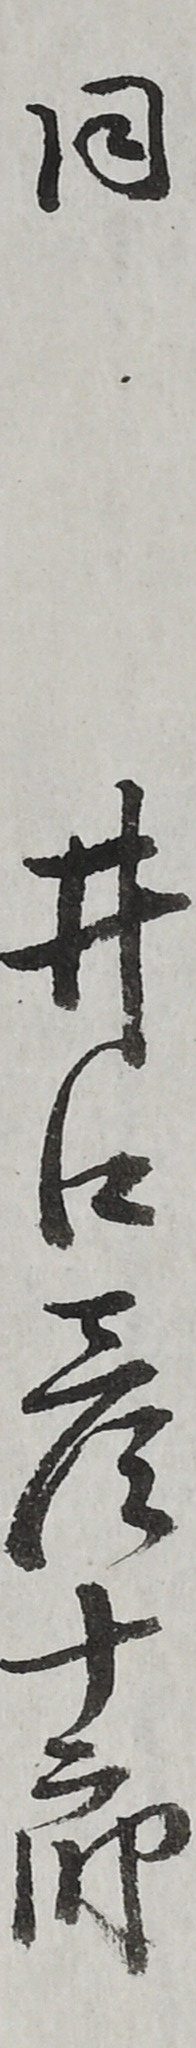同井口彦十郎
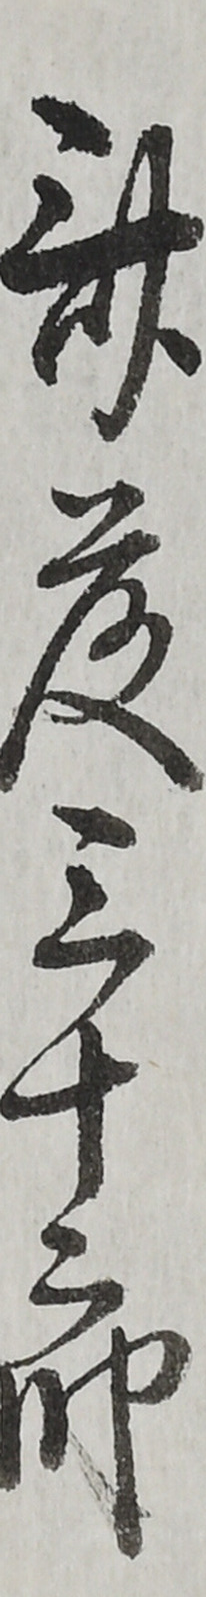同斎藤三十郎
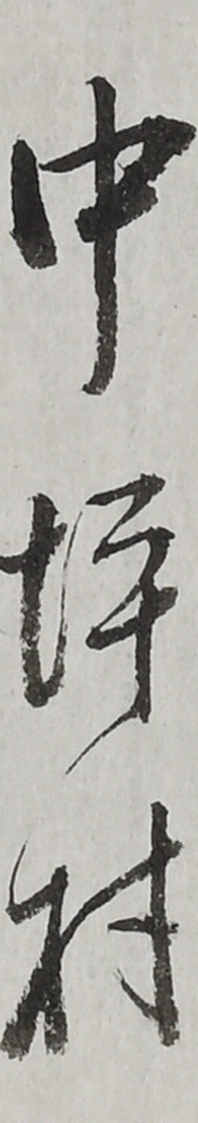中坪村
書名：伊那郡毎村戸長副戸長名簿
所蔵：伊那市立高遠町図書館・合同会社AMANE
